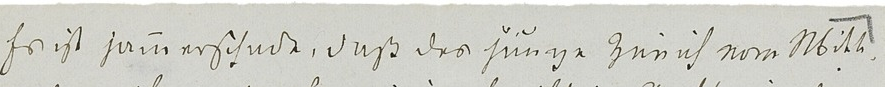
Es ist jammerschade, daß das junge Zürich vom Mitt-
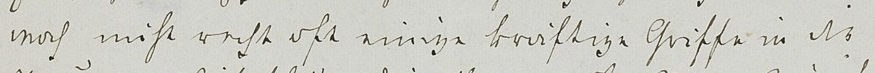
woch nicht recht oft einige kräftige Griffe in die
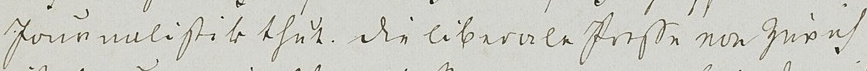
Journalistik thut. Die liberale Presse von Zürich
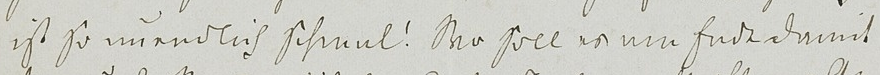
ist so unendlich schmal! Wo soll es am Ende damit
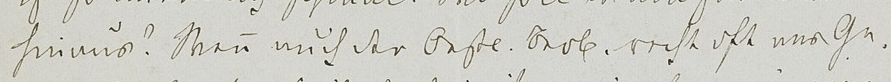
hinaus? Wenn auch der Oestl. Beob. recht oft ans Ge-
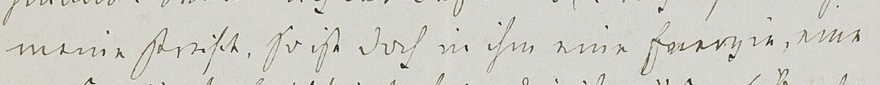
meine streift, so ist doch in ihm eine Energie, eine
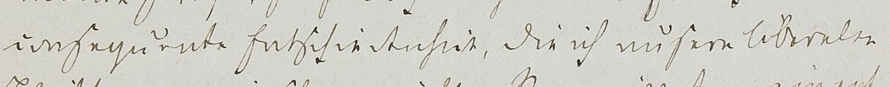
consequente Entschiedenheit, die ich unsern liberalen
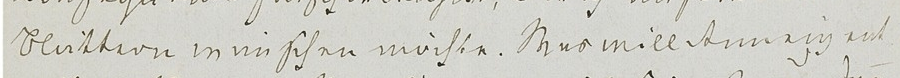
Blättern wünschen möchte. Was will denn eigent-
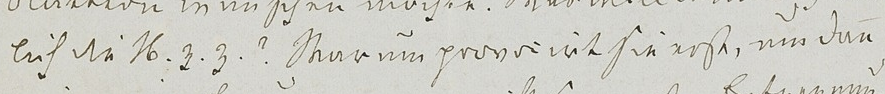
lich die N.Z.Z.? Warum provocirt sie erst, um dann
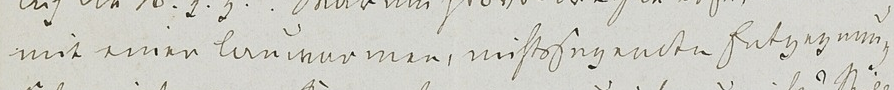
mit einer lauwarmen, nichtssagenden Entgegnung
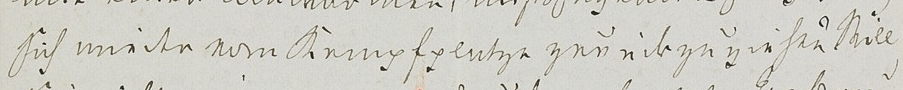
sich wieder vom Kampfplatze zurückzuziehen? Will
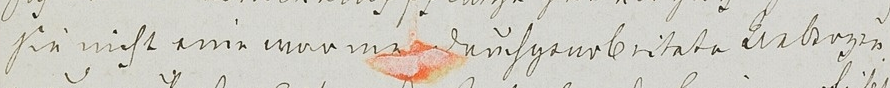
sie nicht eine warme durchgearbeitete Ueberzeu-
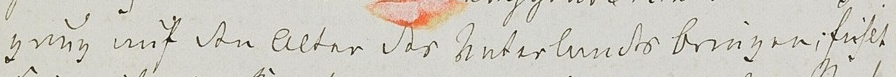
gung auf den Altar des Vaterlandes bringen; fühlt
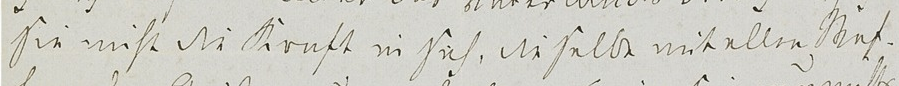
sie nicht die Kraft in sich, dieselbe mit allen Waf-
